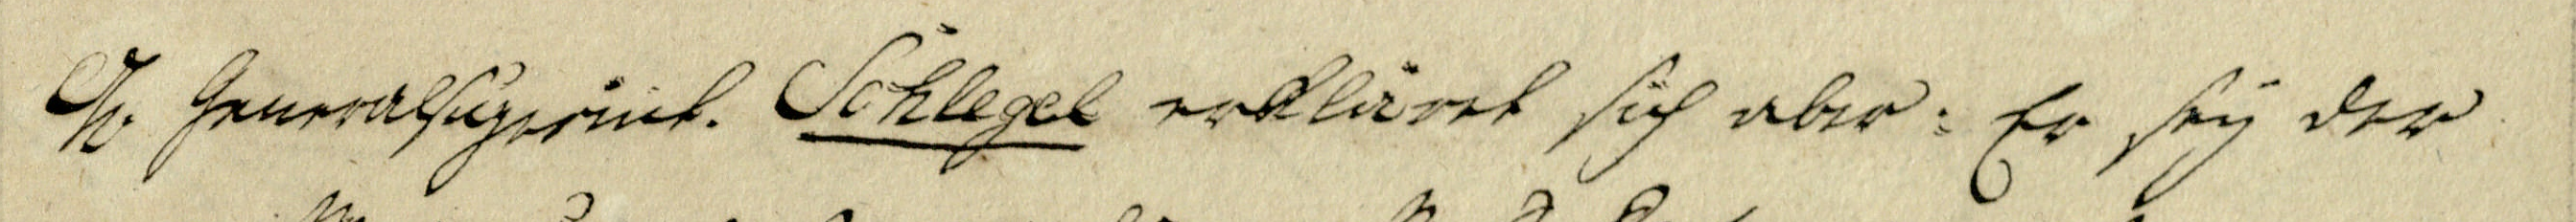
dh. Generalsuperint. Schlegel erkläret sich aber: Er seÿ der
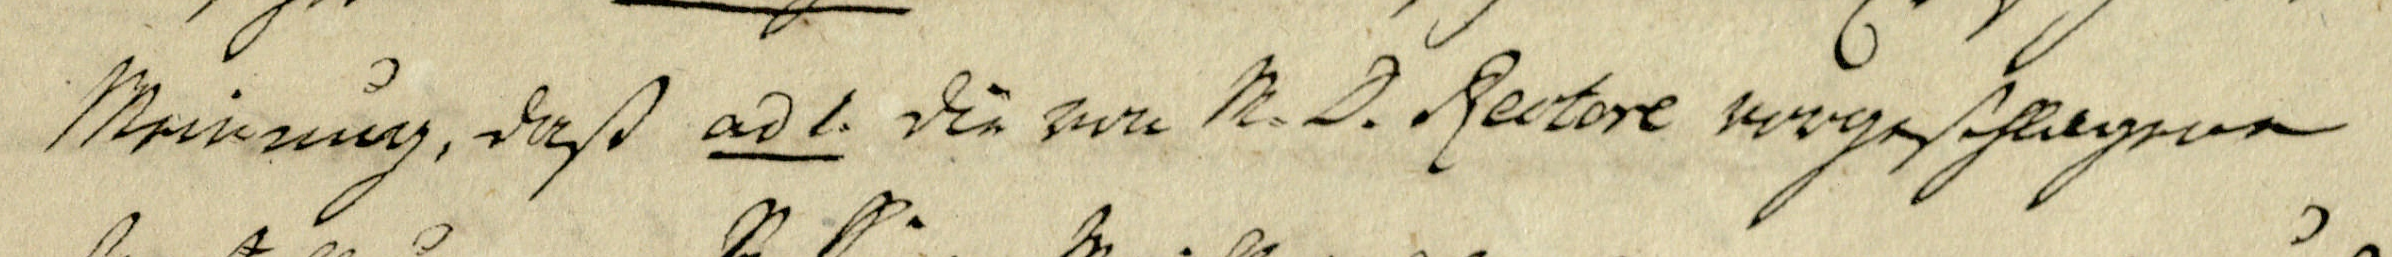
Meinung, daß ad 1. die von M. D. Rectore vorgeschlagene
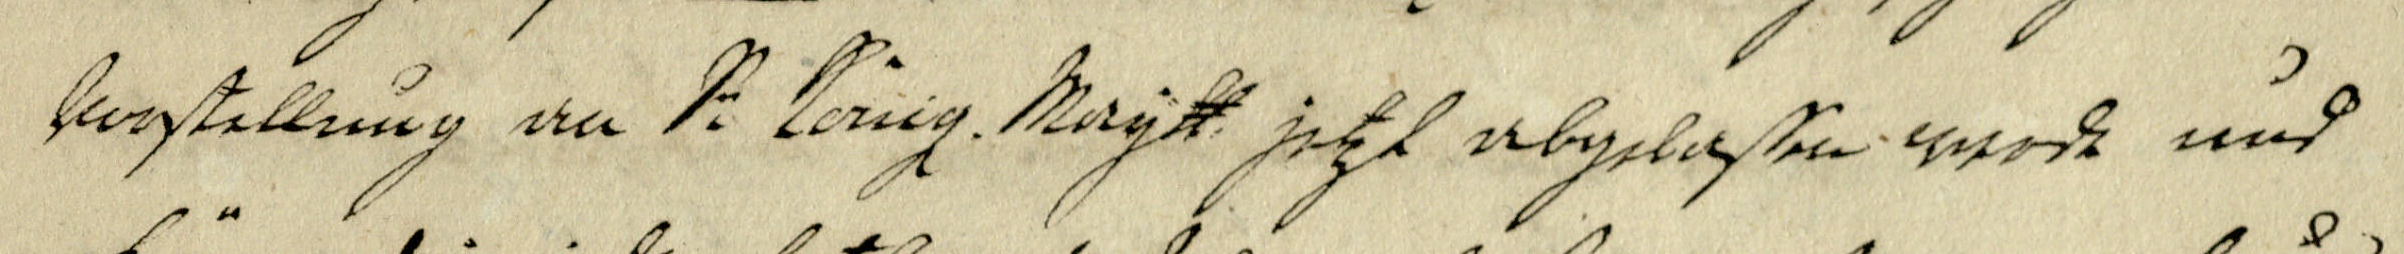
Vorstellung an Sr. Königl. Maÿtt jetzt abgelassen werde und
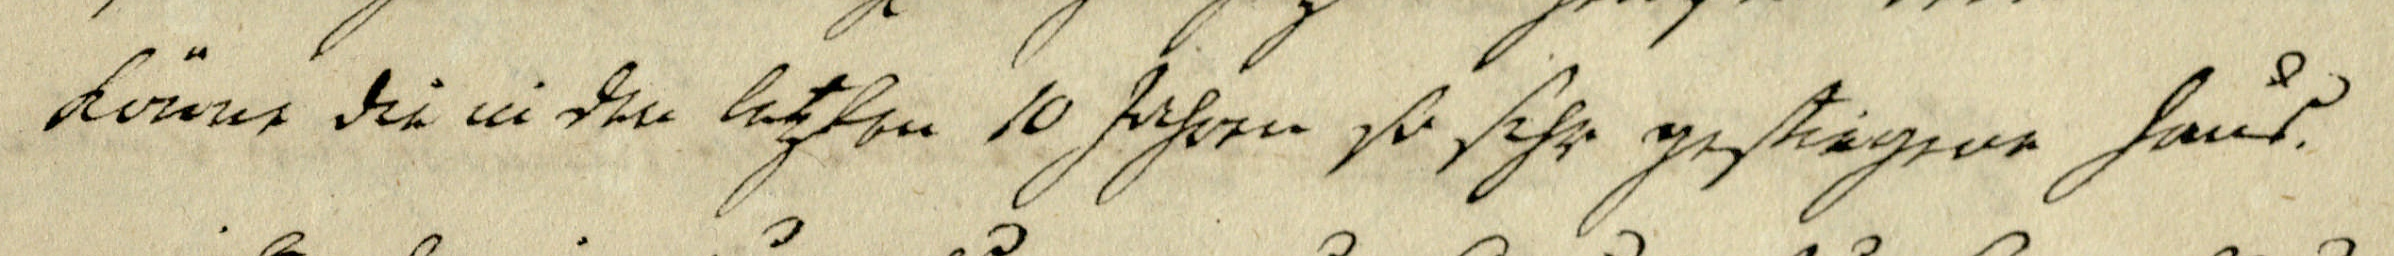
könne die in den letzten 10 Jahren so sehr gestiegene Haus
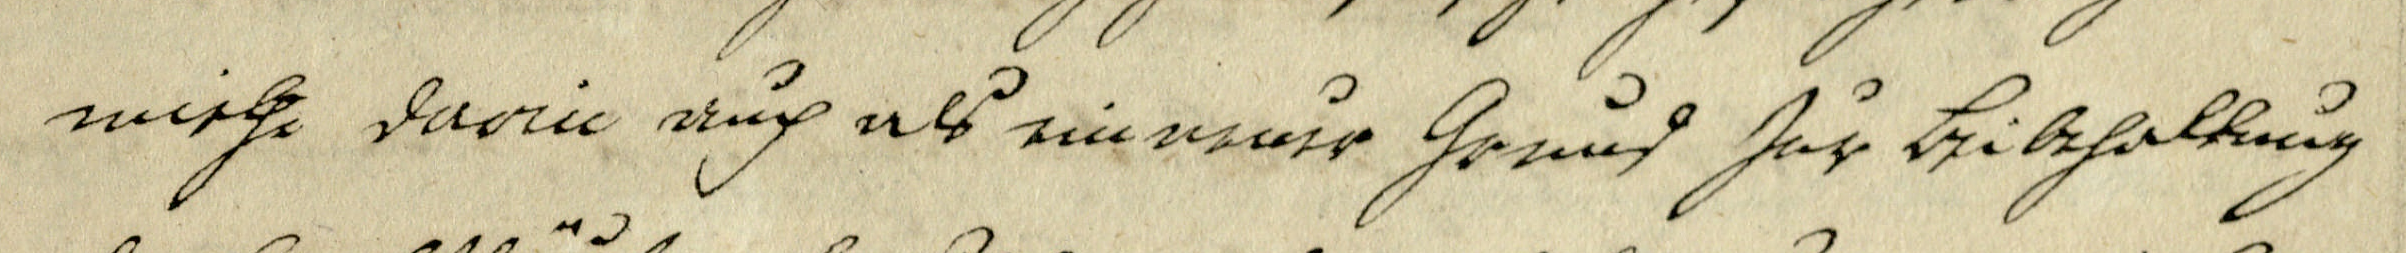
miethe darin auch als ein neuer Grund zur Beibehaltung
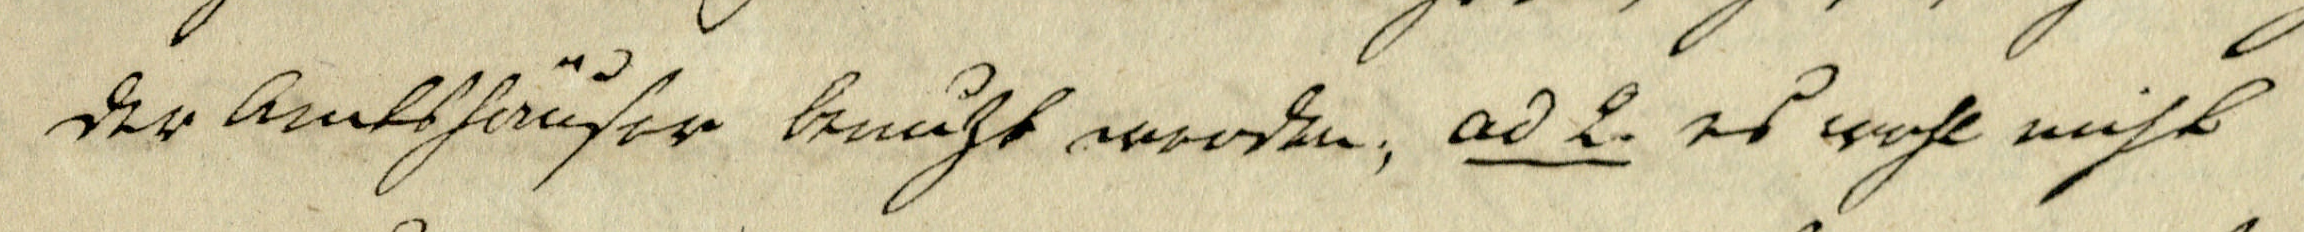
der Amtshäuser benutzt werden, ad 2. es wohl nicht
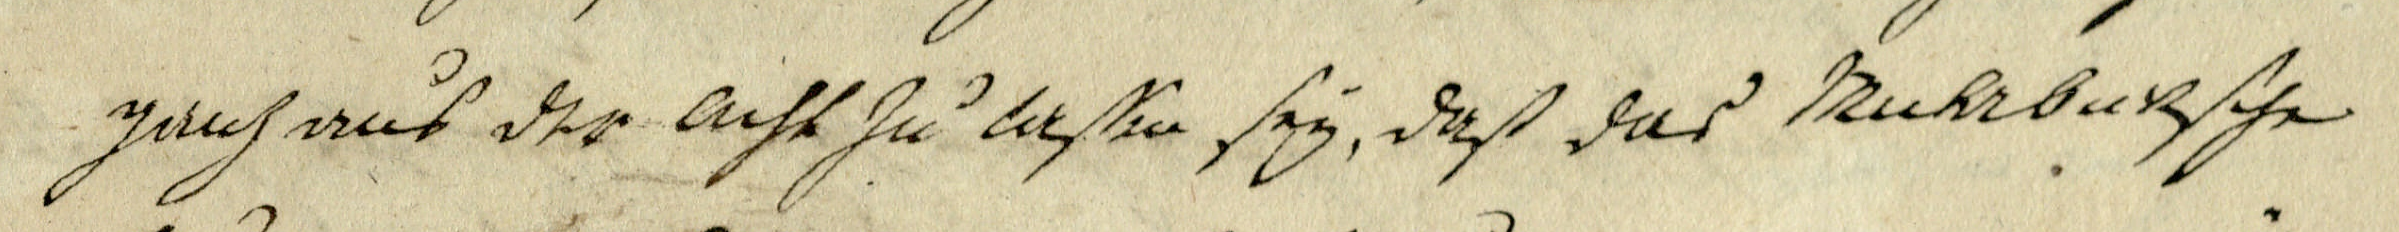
ganz aus der Acht zu lassen seÿ, daß das Muhrbecksche
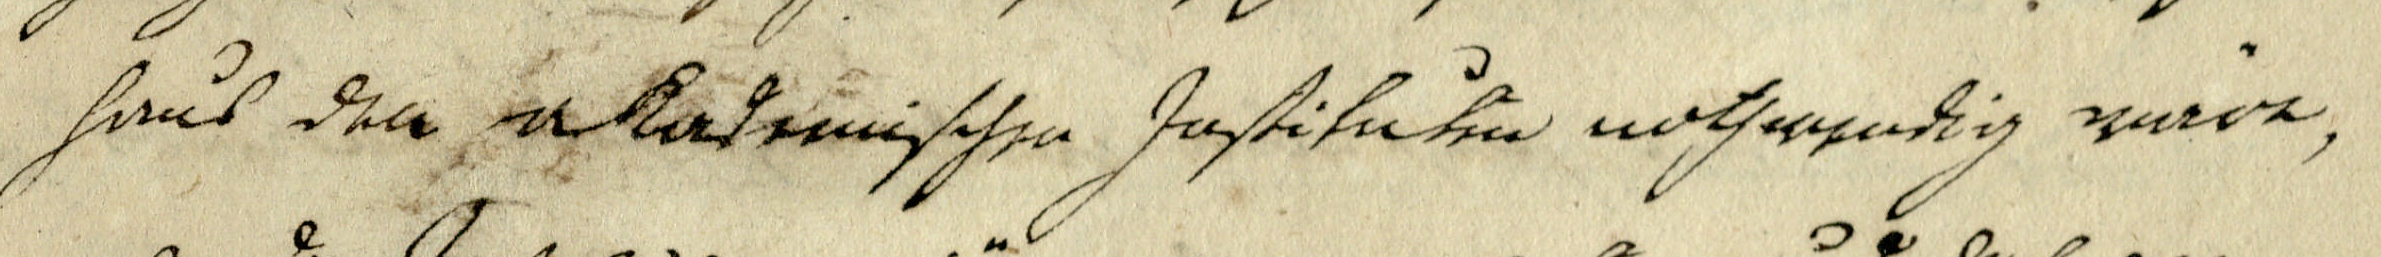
Haus den akademischen Instituten nothwendig wäre,
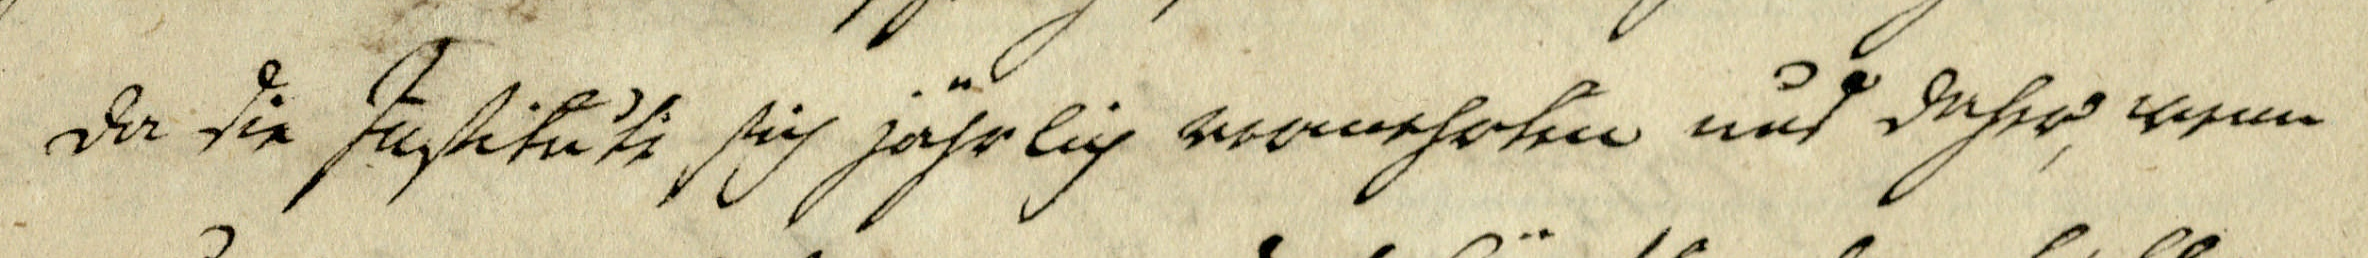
da die Institute sich jährlich vermehrten und daher, wenn
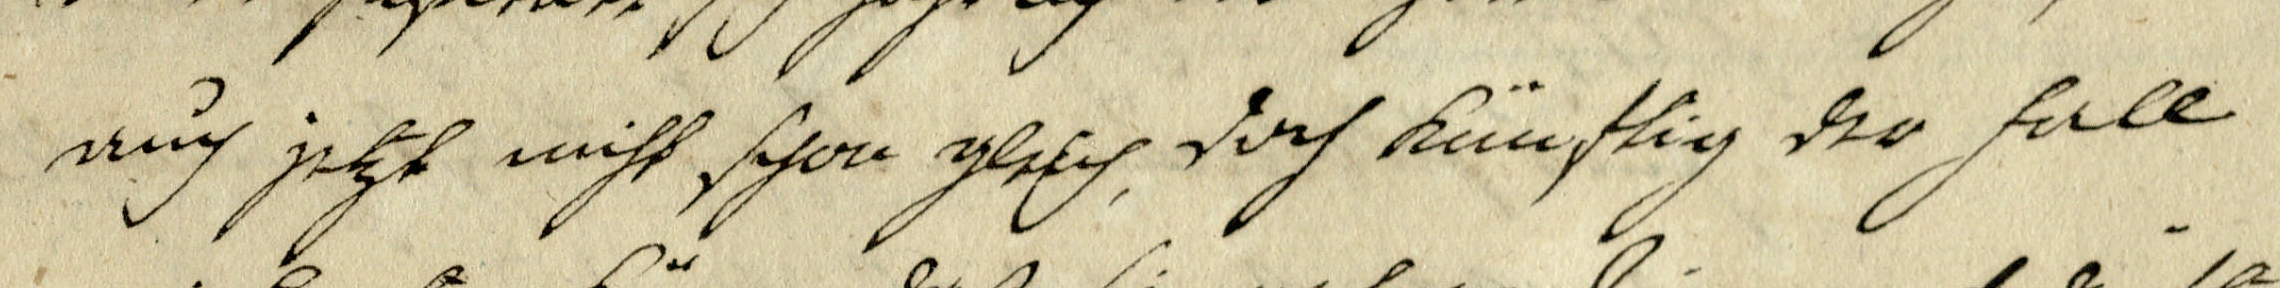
auch jetzt nicht schon gleich, doch künftig der Fall
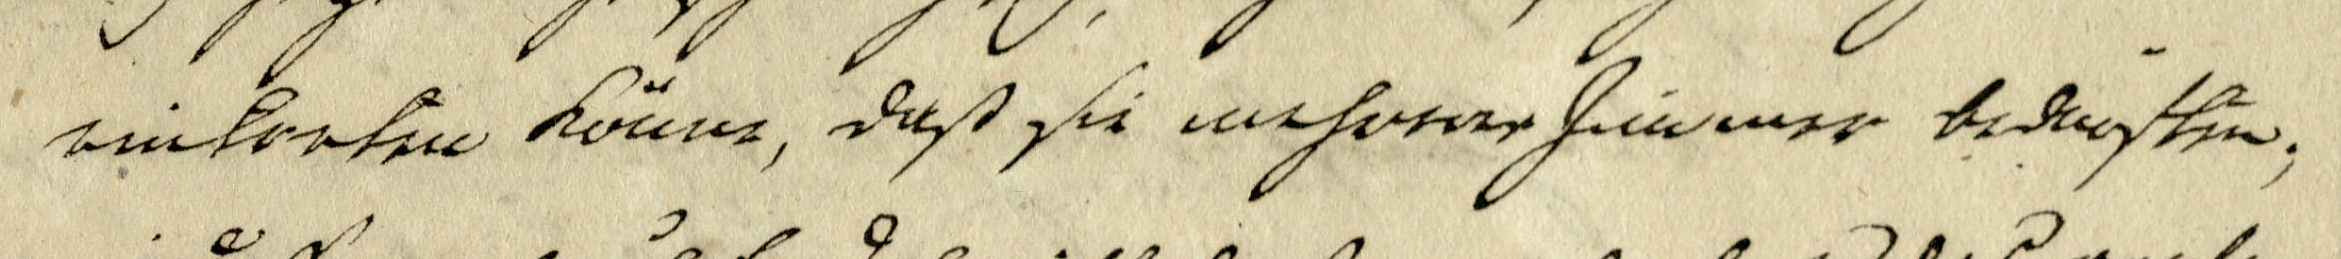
eintreten könne, daß sie mehrerer Zimmer bedürften;
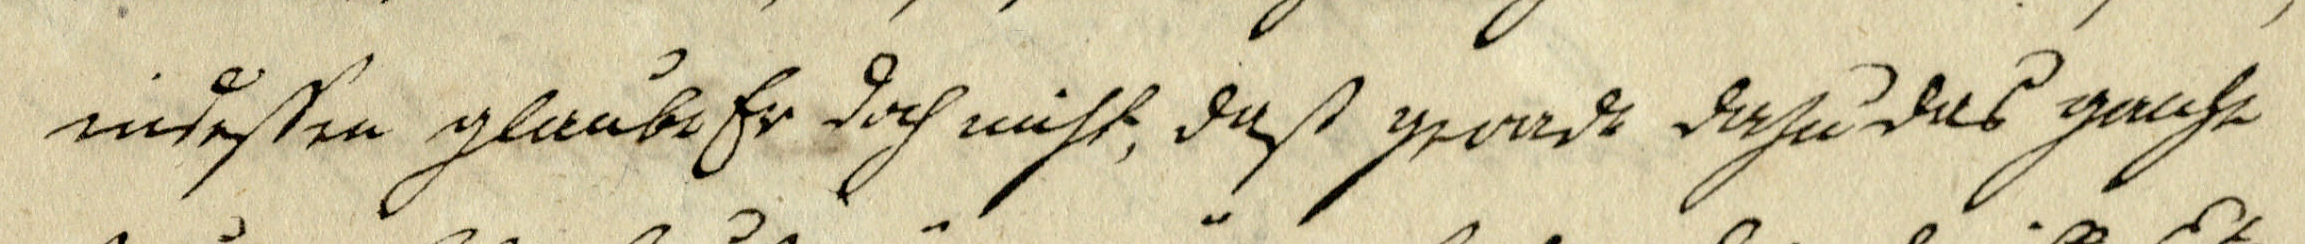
indessen glaube Er doch nicht, daß gerade dazu das ganze
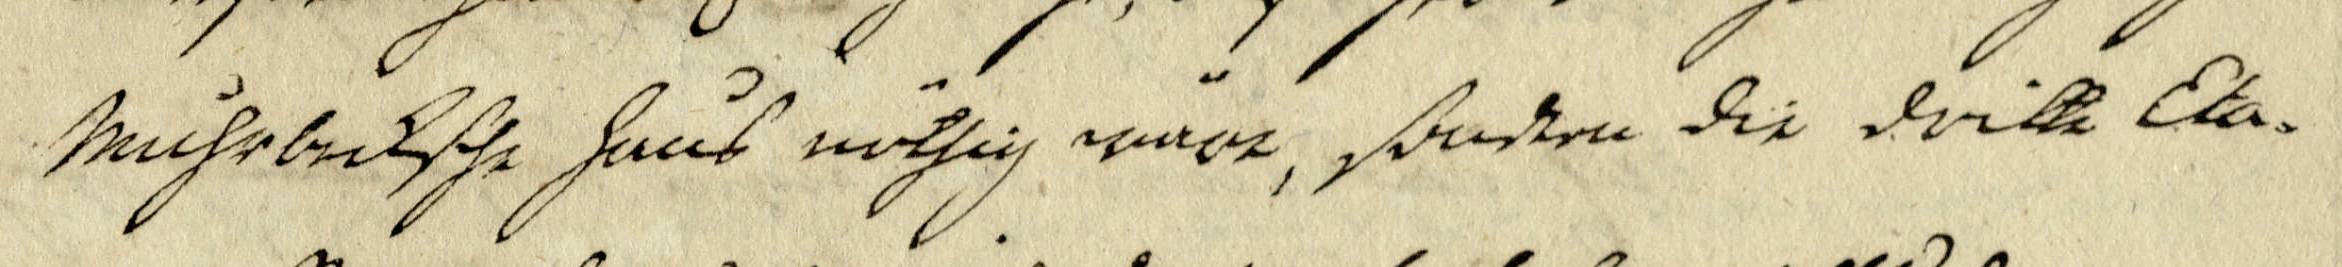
Muhrbecksche Haus nöthig wäre, sondern die dritte Eta¬
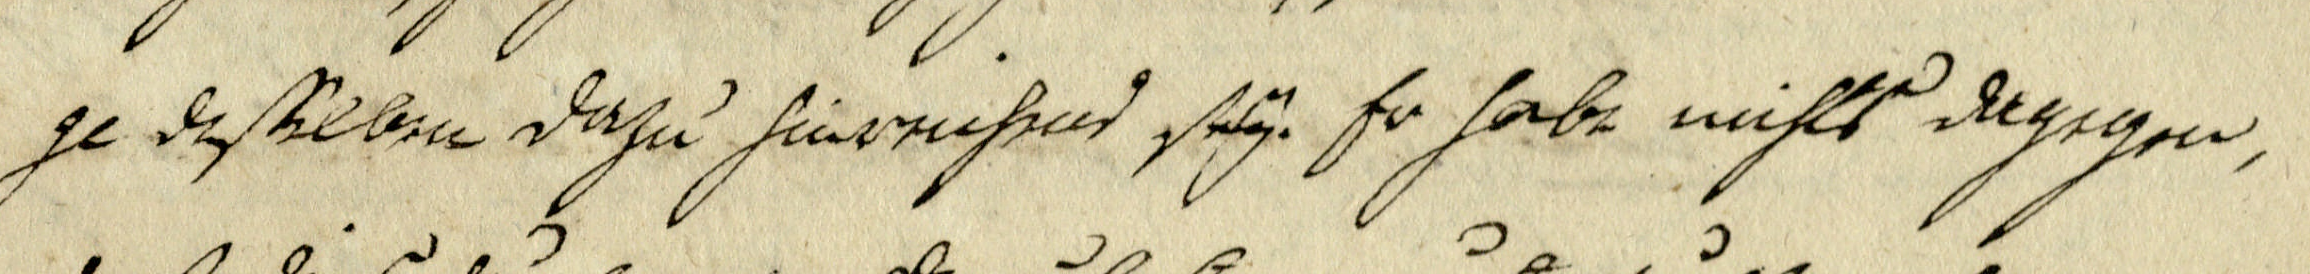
ge desselben dazu hinreichend seÿ. Er habe nichts dagegen,
